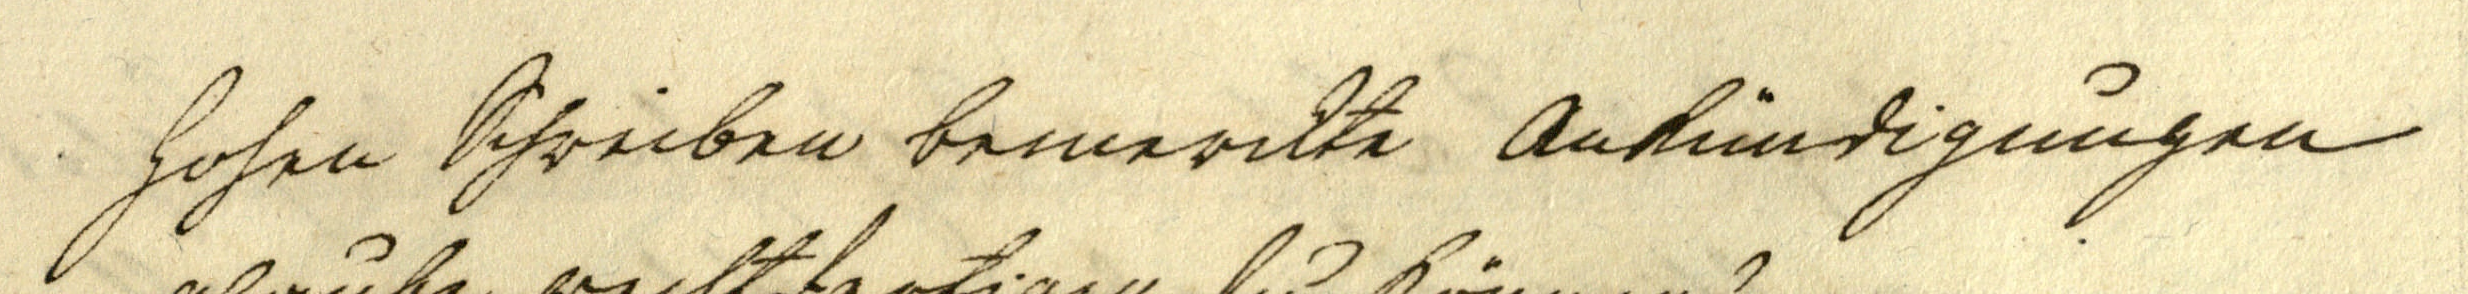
hohen Schreiben bemerckte Ankündigungen
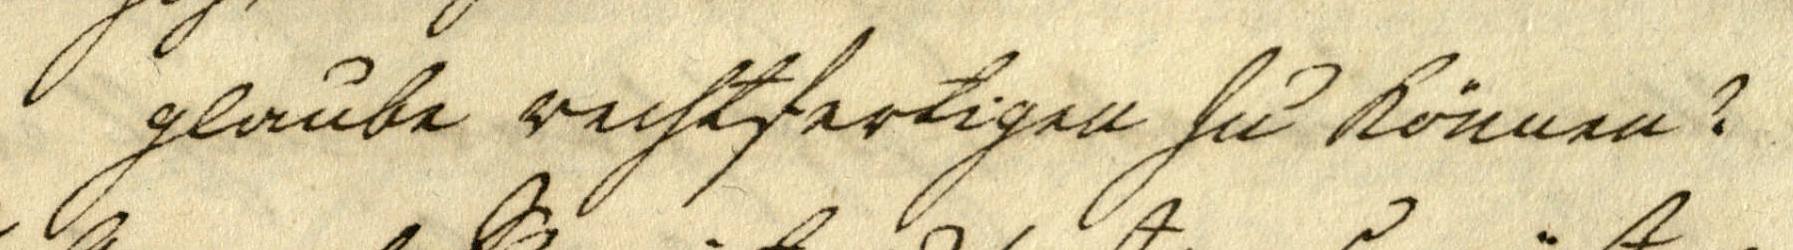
glaube rechtfertigen zu können?
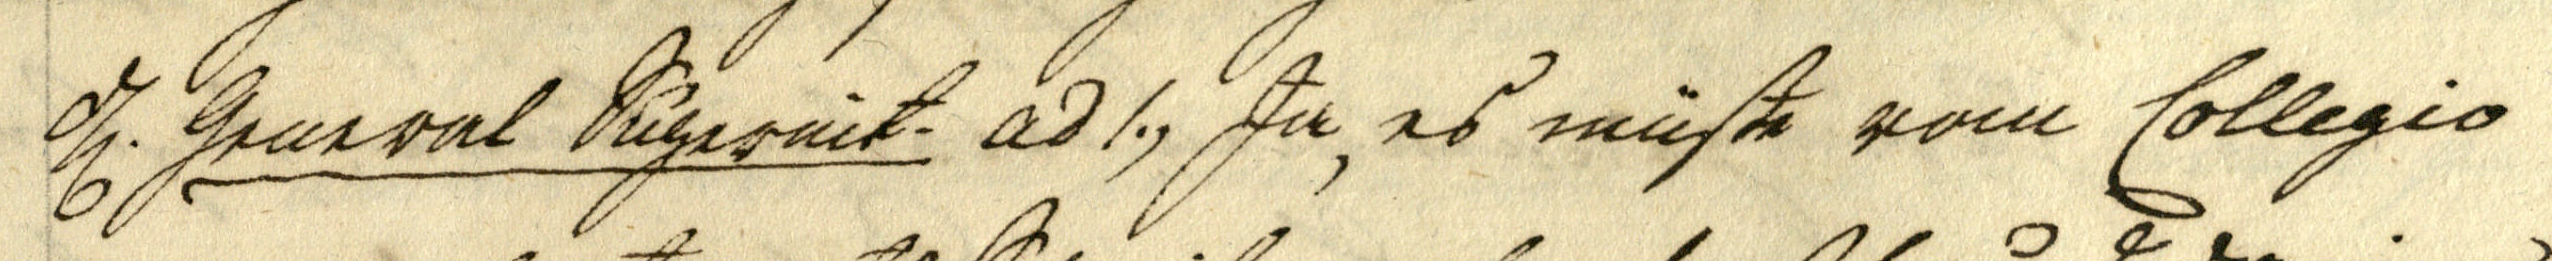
dh. General Superint. ad 1., Ja es müßte vom Collegio
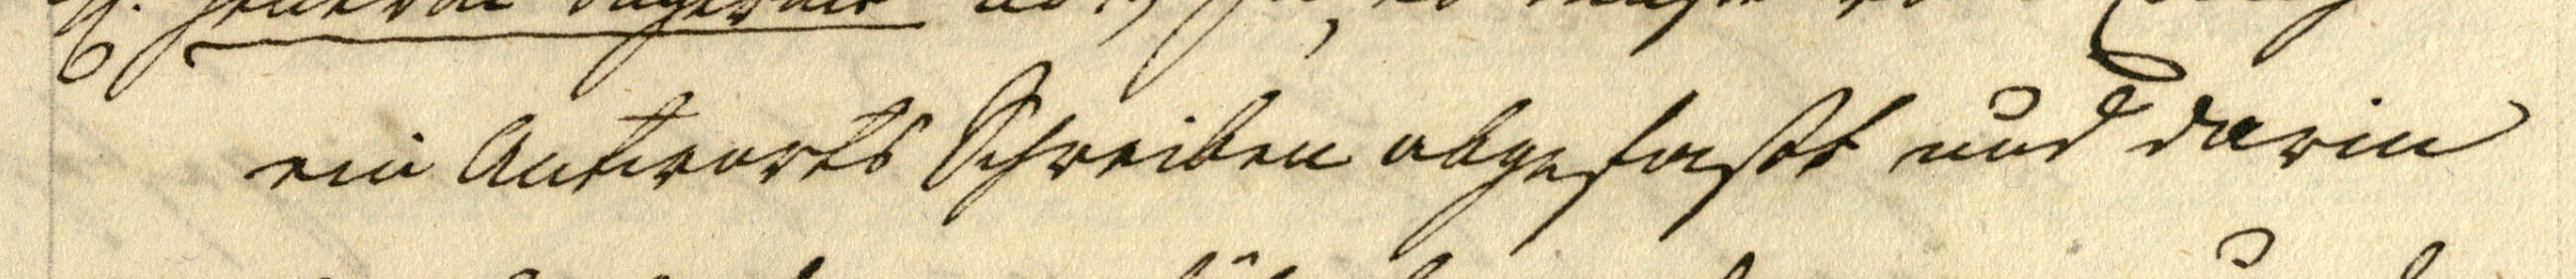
ein Antworts Schreiben abgefaßt und darin
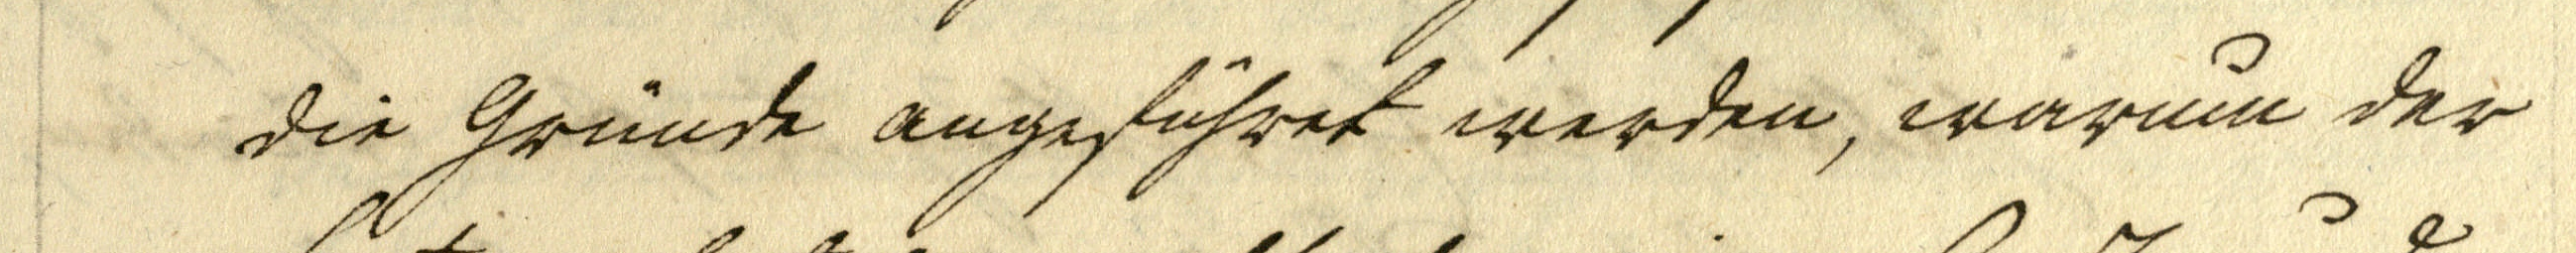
die Gründe angeführet werden, warum der
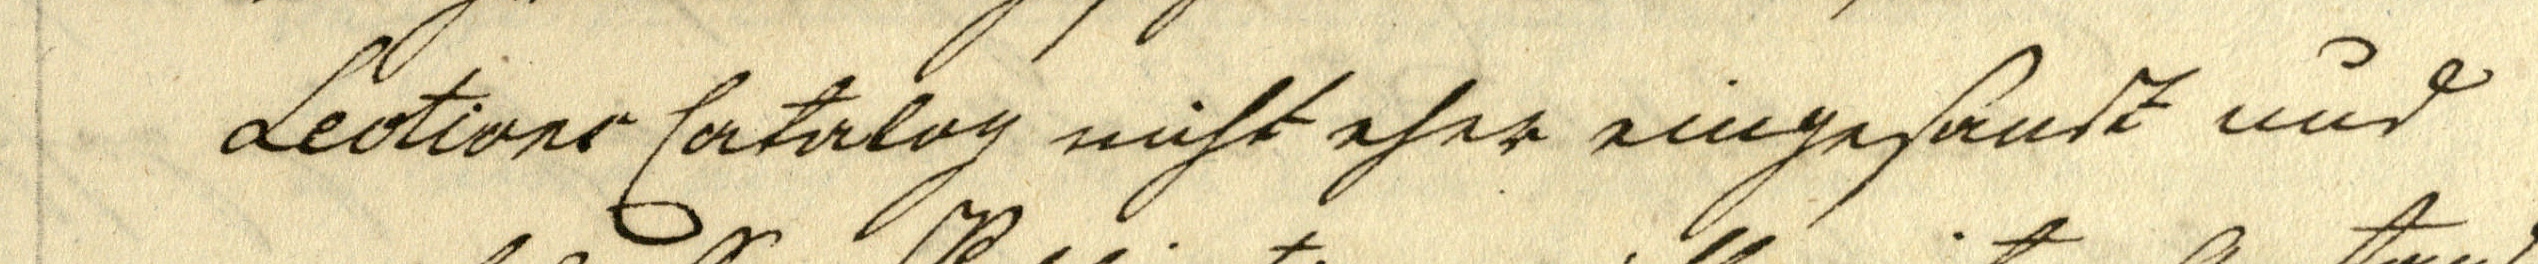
Lections Catalog nicht eher eingesandt und
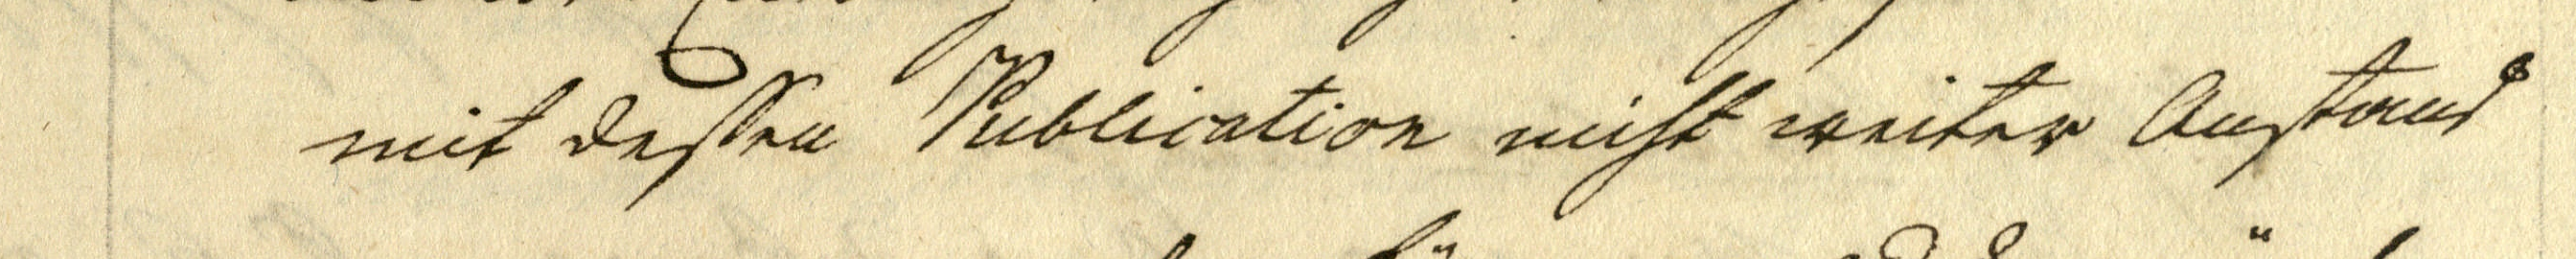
mit dessen Publication nicht weiter Anstand
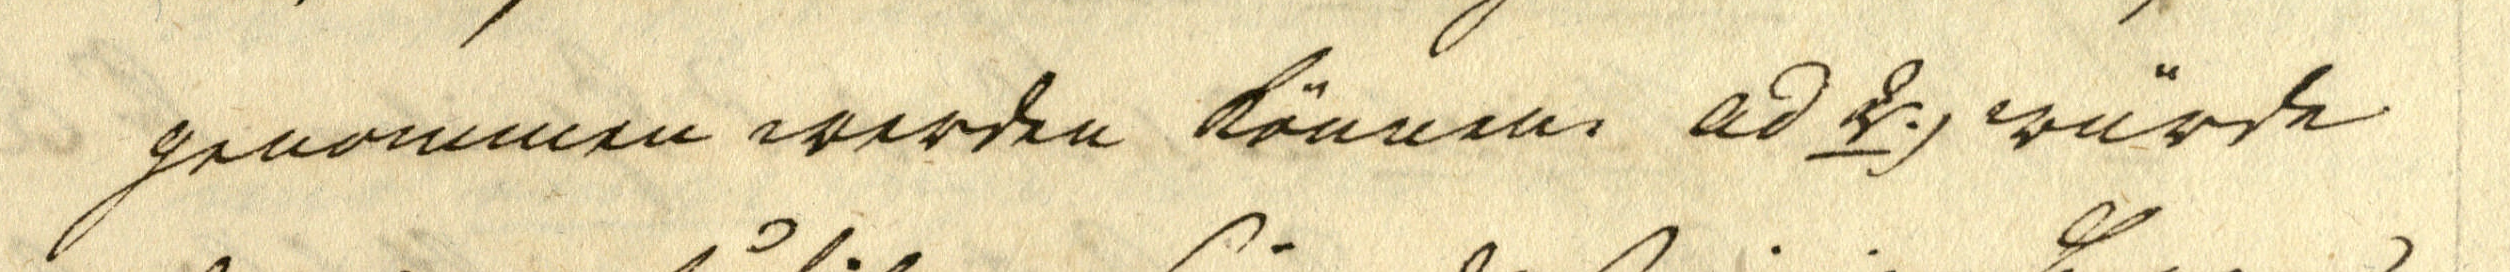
genommen werden können: ad 2., würde
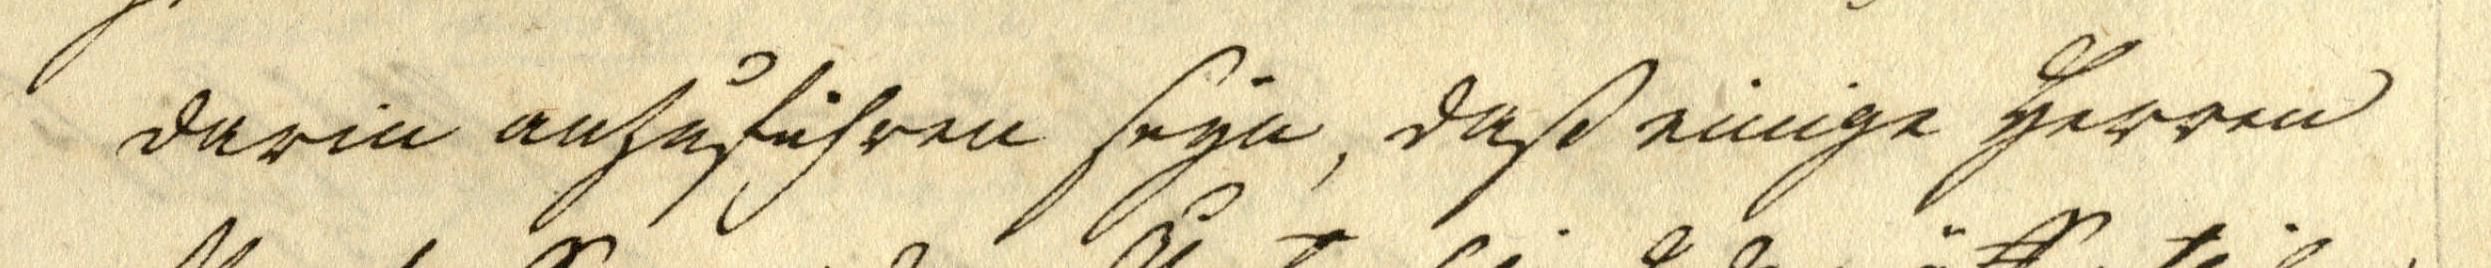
darin anzuführen seÿn, daß einige Herren
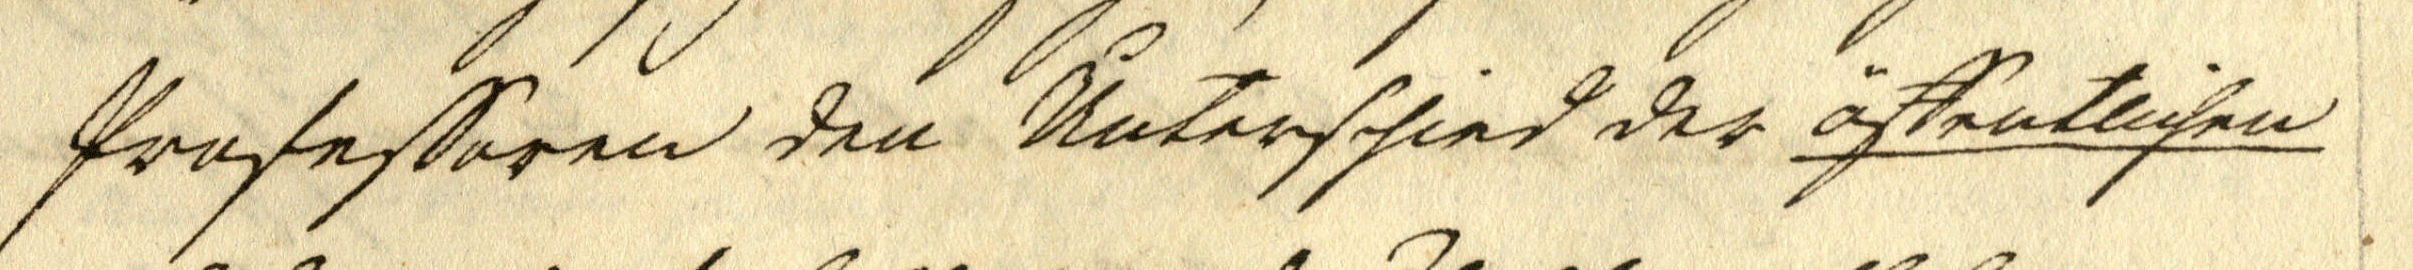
Professoren den Unterschied der öffentlichen
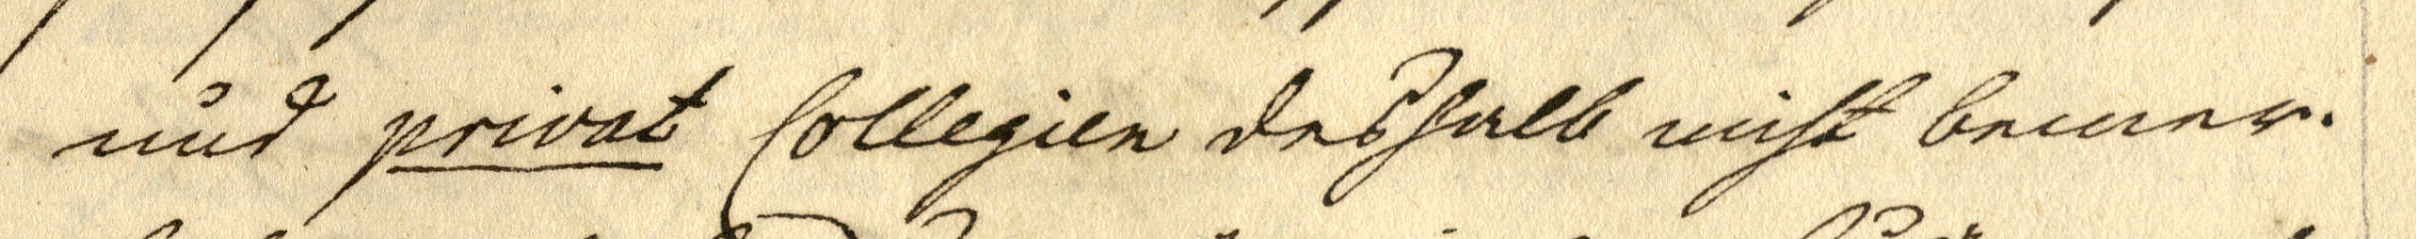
und privat Collegien deshalb nicht bemer¬
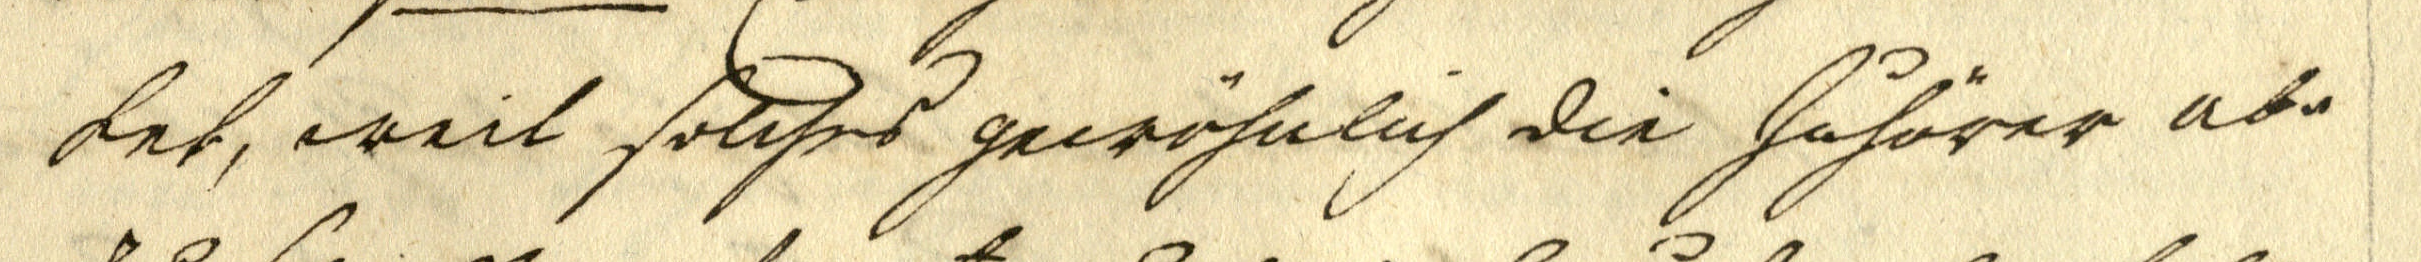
ket, weil solches gewöhnlich die Zuhörer ab¬
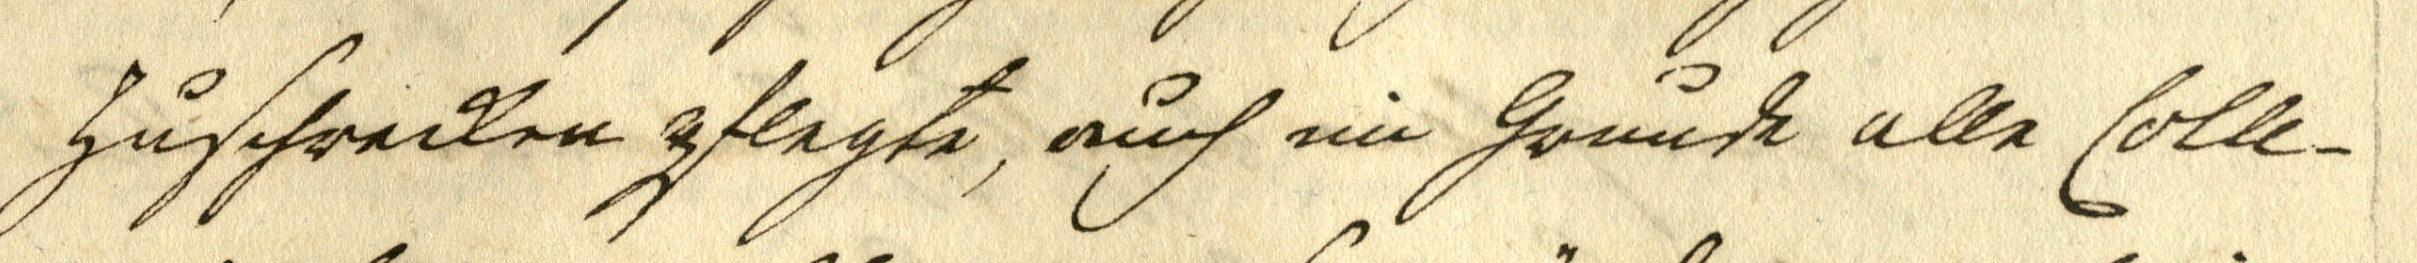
zuschrecken pflegte, auch im Grunde alle Colle¬
